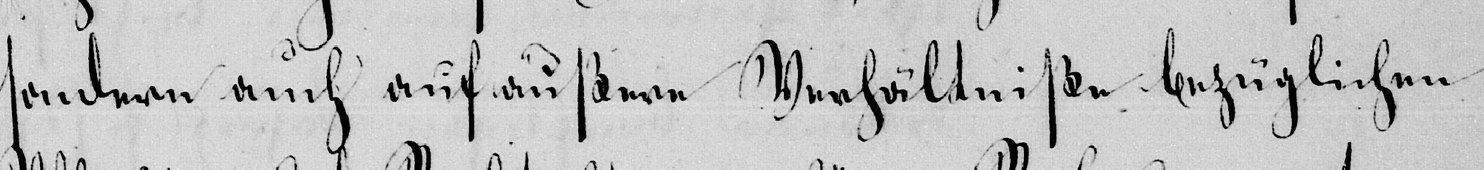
sondern auch auf äußere Verhältniße bezüglichen
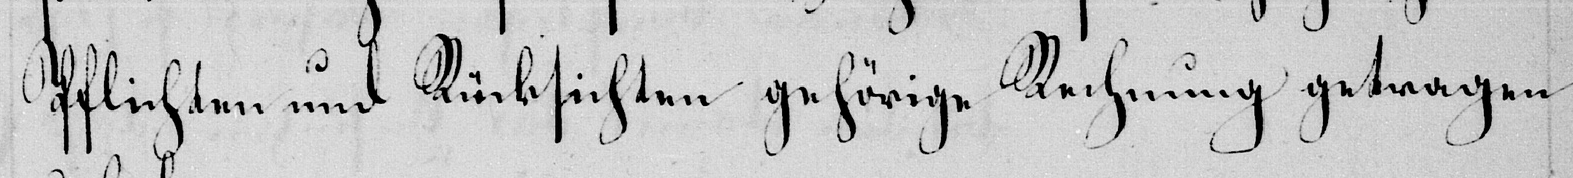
Pflichten und Rücksichten gehörige Rechnung getragen
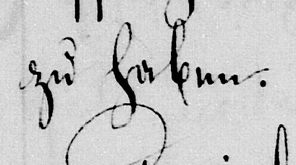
zu haben.
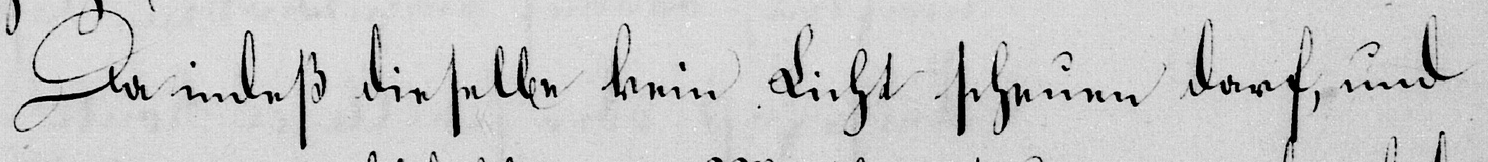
Da indeß dieselbe kein Licht scheuen darf, und
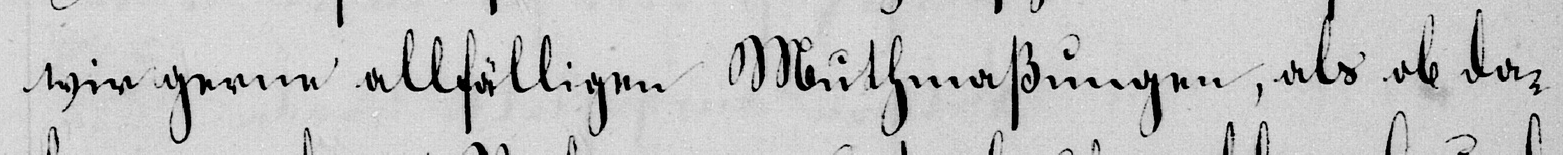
wir gerne allfälligen Muthmaßungen, als ob da¬
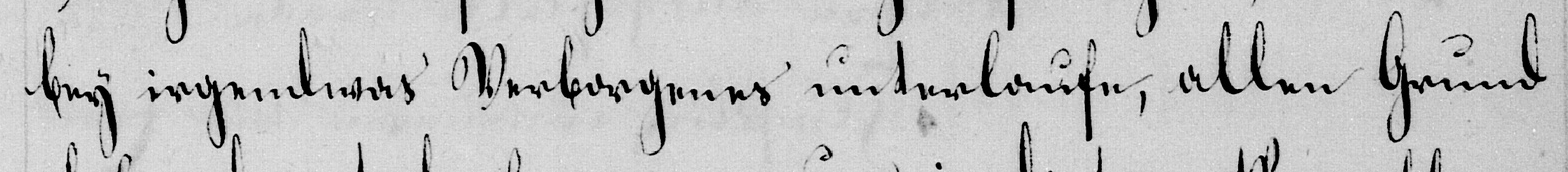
bey irgendwas Verborgenes unterlaufe, allen Grund
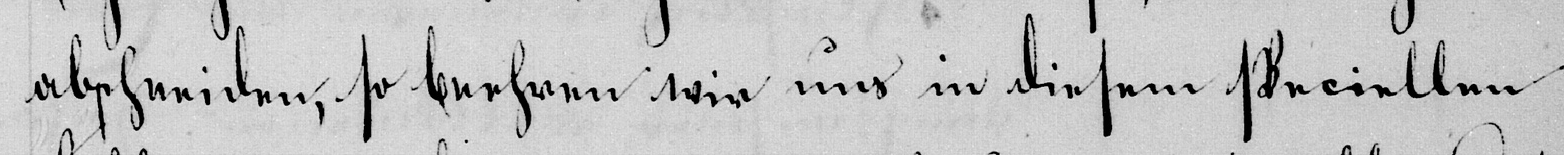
abschneiden, so beehren wir uns in diesem speciellen
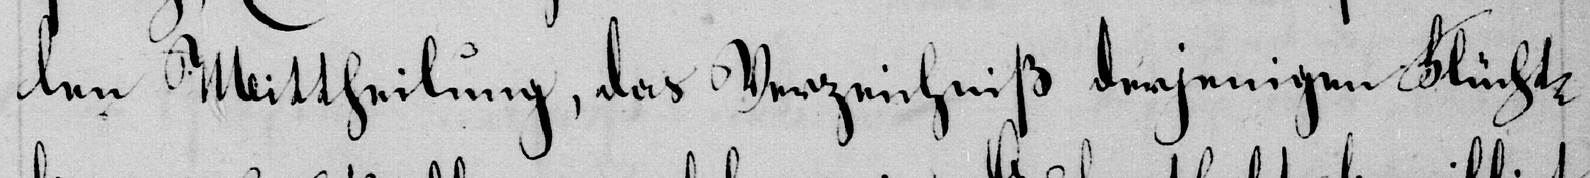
en Mittheilung, das Verzeichniß derjenigen Flücht¬
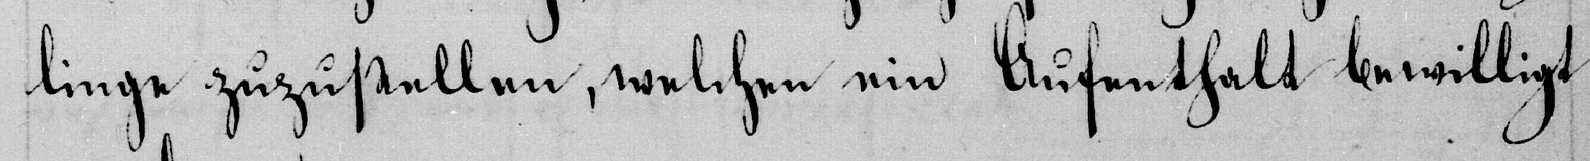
linge zuzustellen, welchen ein Aufenthalt bewilligt
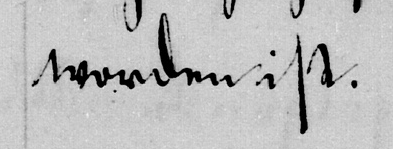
worden ist.
